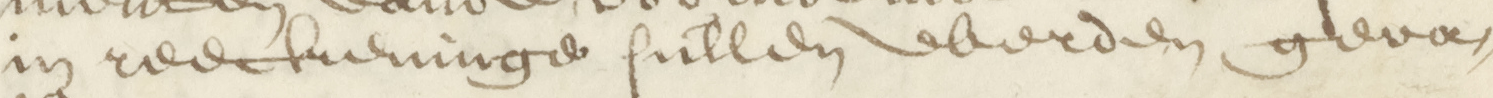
in reeckeninge sullen werden geva„
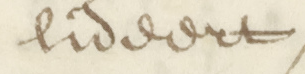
lideert.
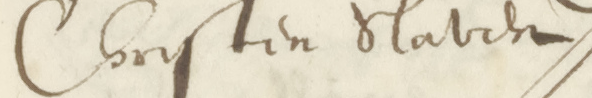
Christen Slaven
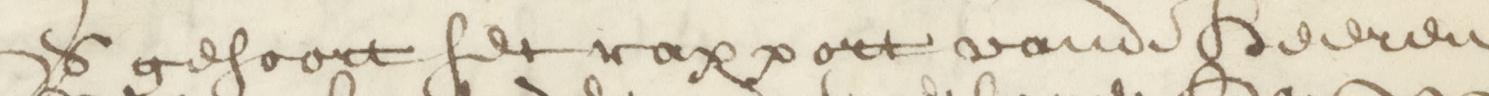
Is gehoort het rapport vande Heeren
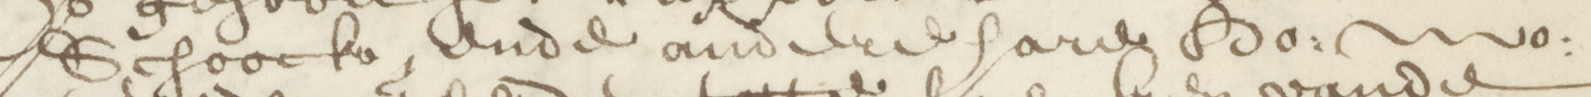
Schoock, ende andere haren Ho:Mo:
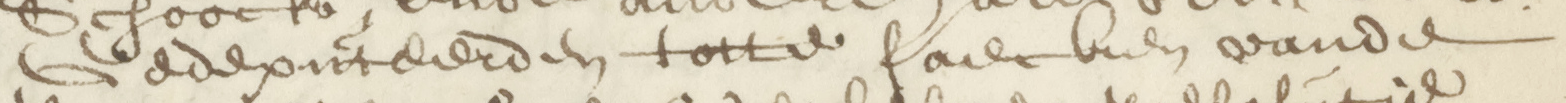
Gedeputeerden totte saecken vande
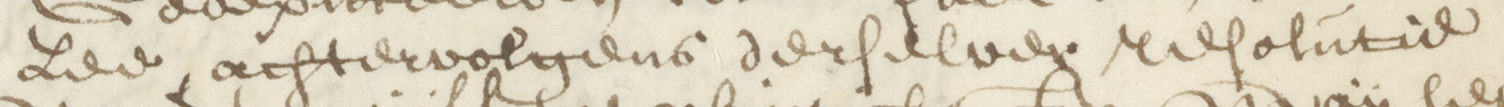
Zee, achtervolgens derselver resolutie
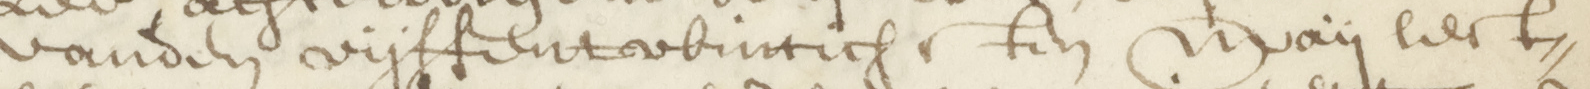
vanden vijffentwintichsten Maij lest„
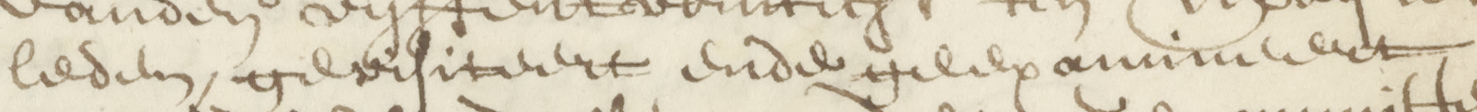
leden, gevisiteert ende geexamineert
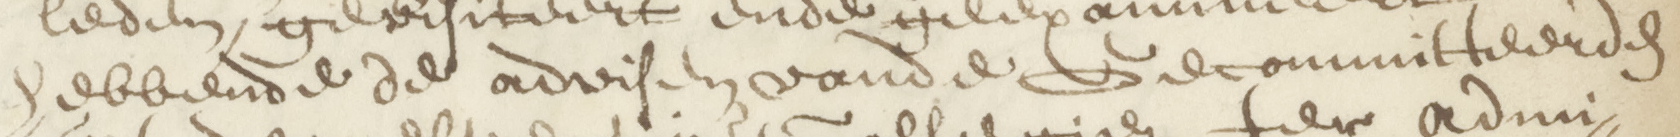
hebbende de advisen vande Gecommitteerden
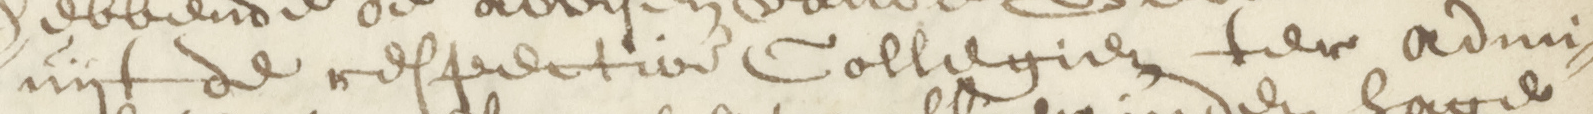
uijt de respective Collegien ter Admi„
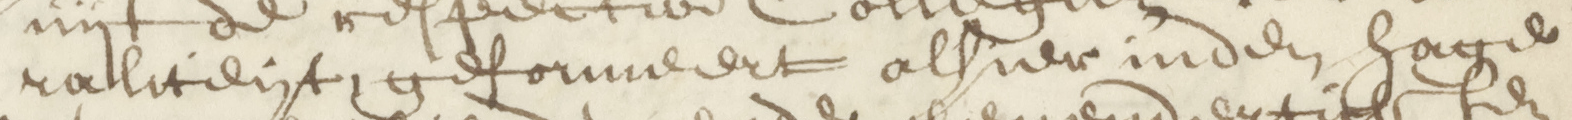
raliteijt, geformeert alhier inden Hage
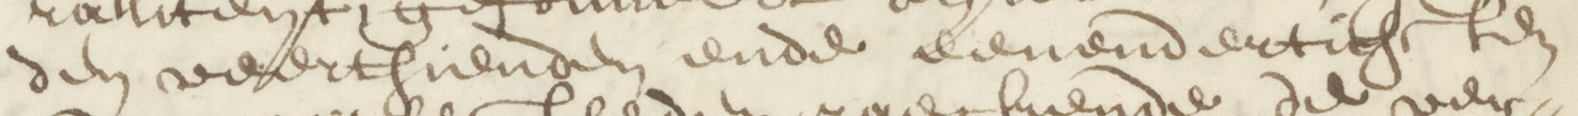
den veerthienden ende eenendertichsten
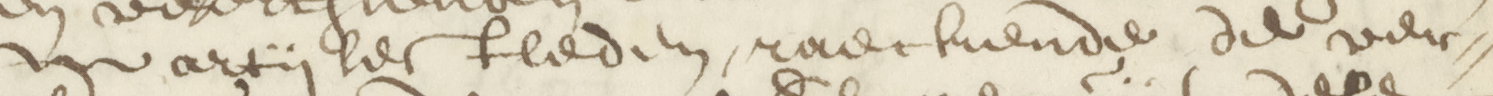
Martij lestleden, raeckende de ver„
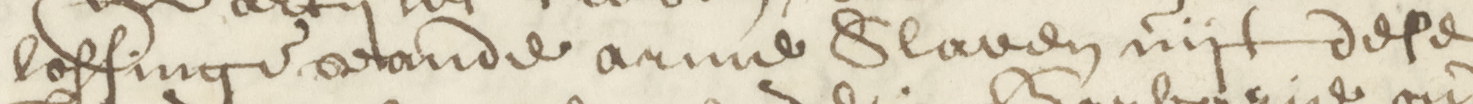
lossinge vande arme Slaven uijt dese
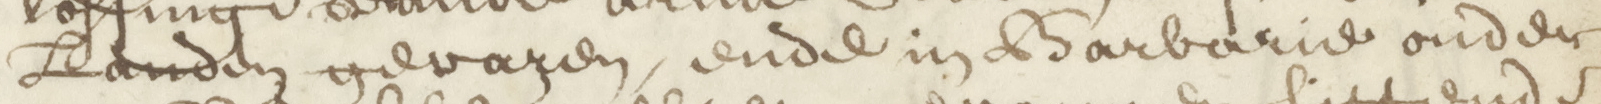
Landen gevaren, ende in Barbarie onder
